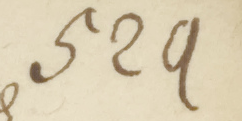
524
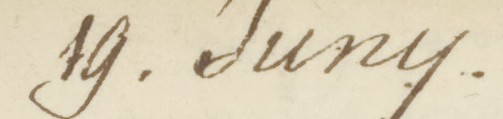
19. Juny.
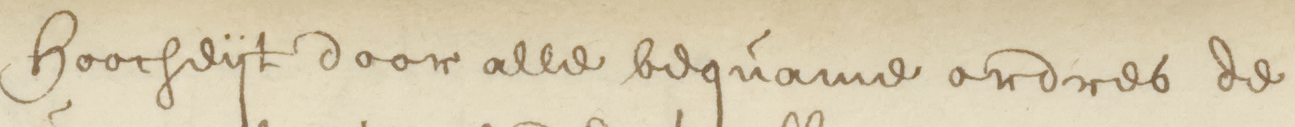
hoocheijt door alle bequame ordres de
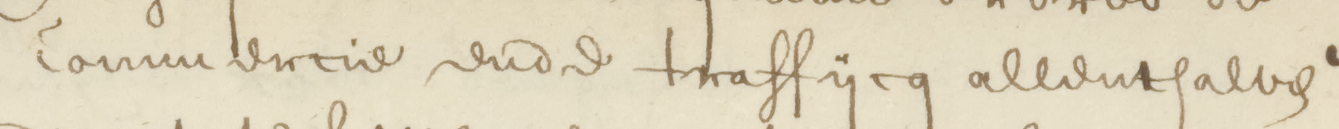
Commercie ende traffijcq allenthalven
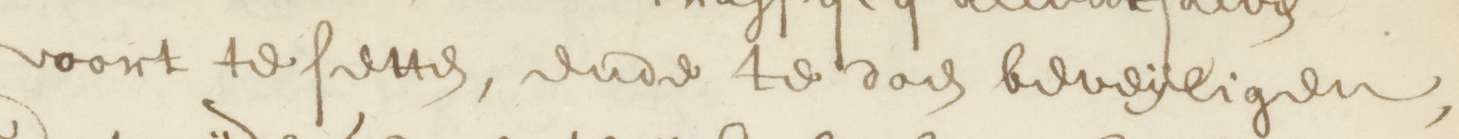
voort te setten, ende te doen beveijligen.
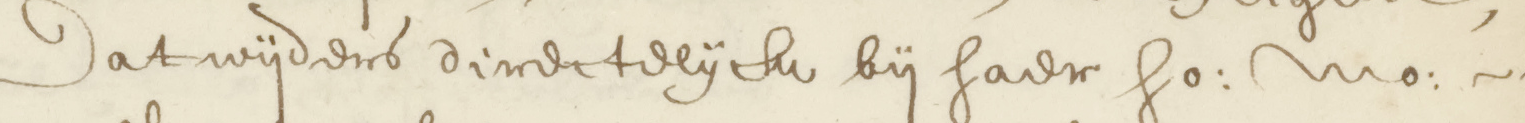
Dat wijders directelijck bij haer Ho:Mo:
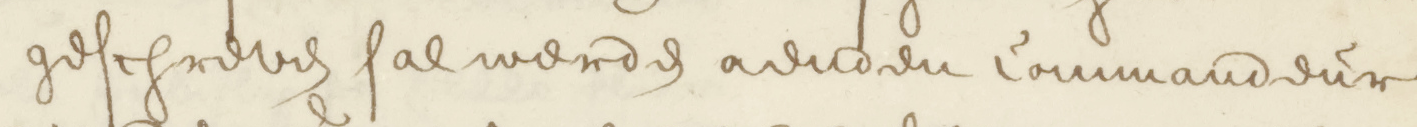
geschreven sal werden aenden Commandeur
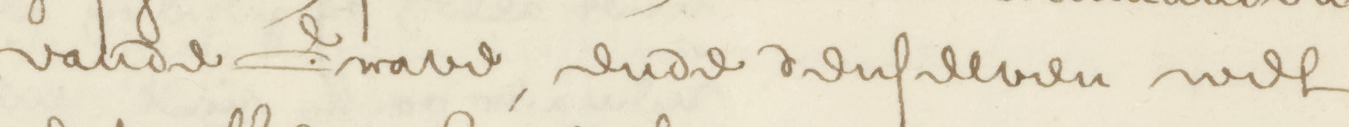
vande Grave, ende denselven wel
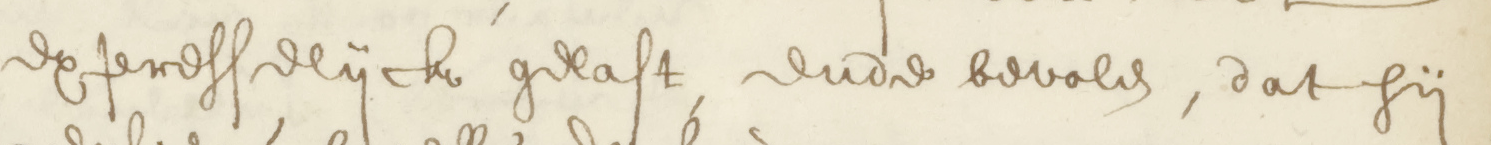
expresselijck gelast, ende bevolen, dat hij
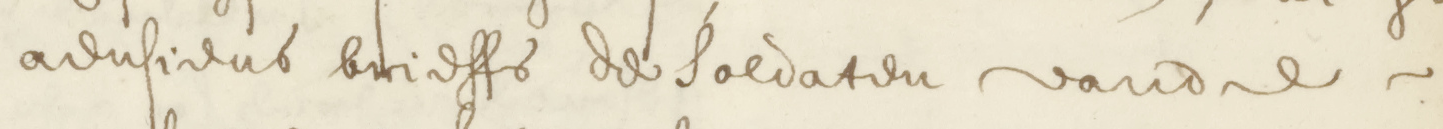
aensiens brieffs de Soldaten vande
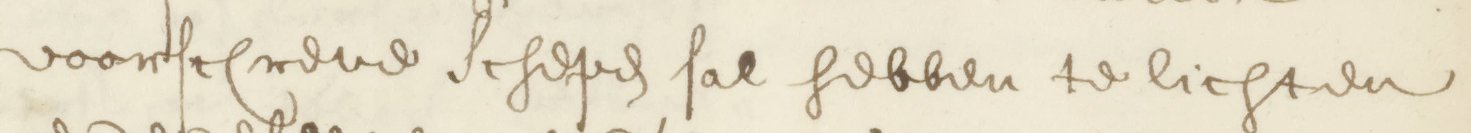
voorschreve Schepen sal hebben te lichten,
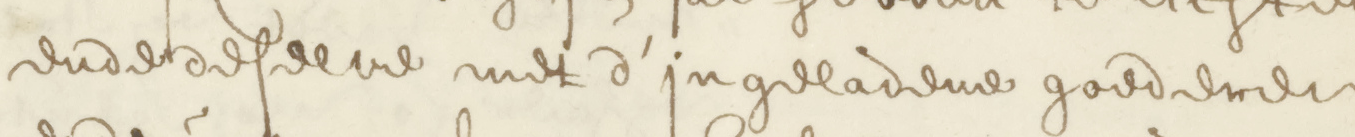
ende deselve met d‛ingeladene goederen
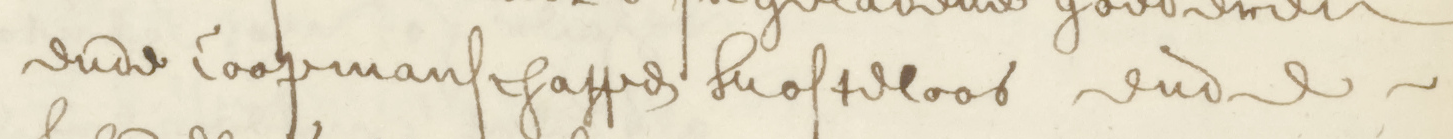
ende Coopmanschappen kosteloos ende
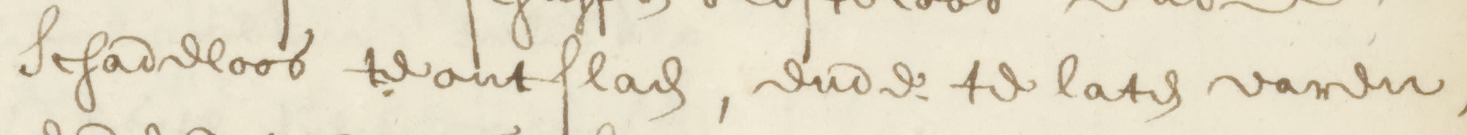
schadeloos te ontslaen, ende te laten varen,
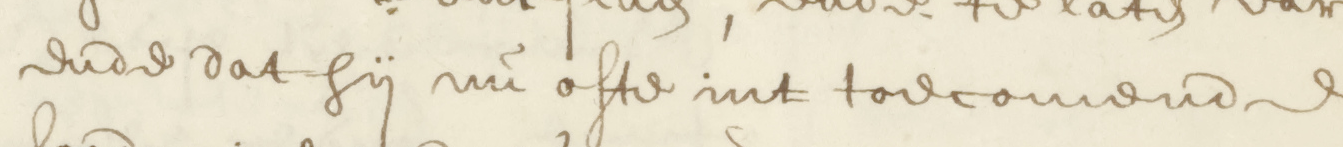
ende dat hij nu ofte int toecomende
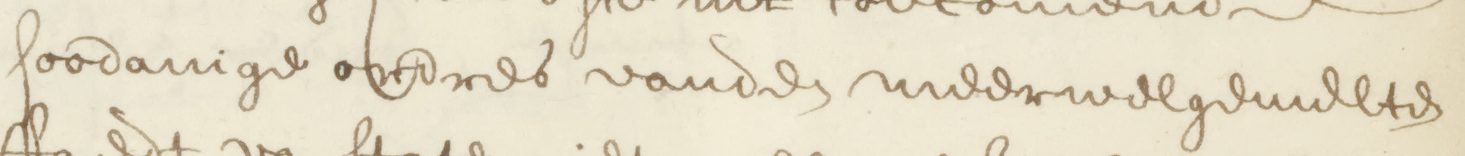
soodanige ordres vanden meerwelgemelten
